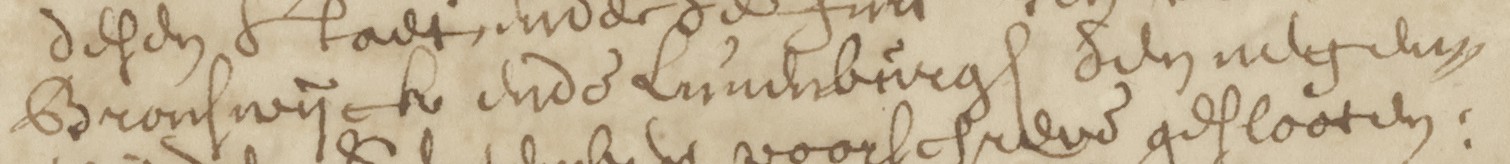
Bronswijck ende Lunenburgh den negen„,
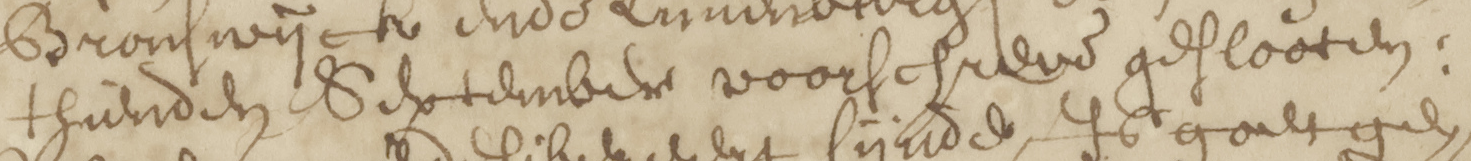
thienden September voorschreve geslooten:
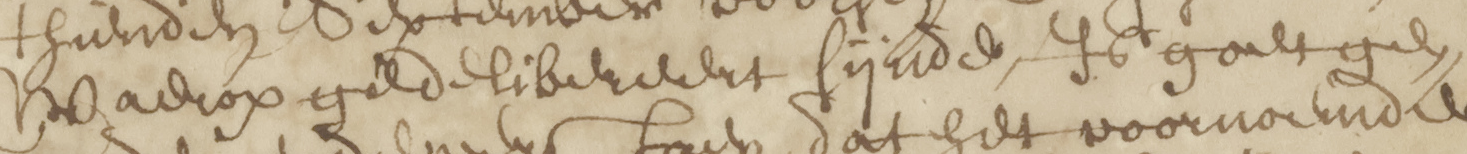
Waerop gedelibereert sijnde, Is goetge„
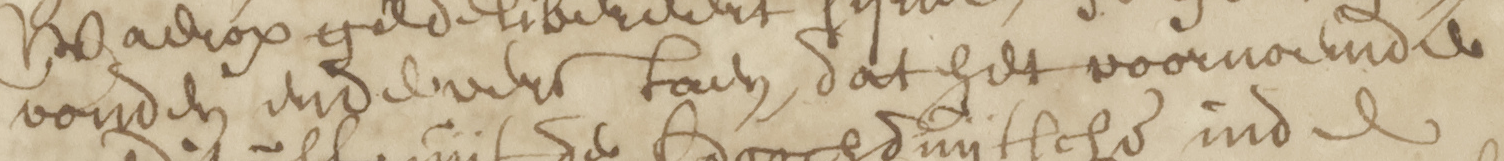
vonden ende verstaen, dat het voornoemde
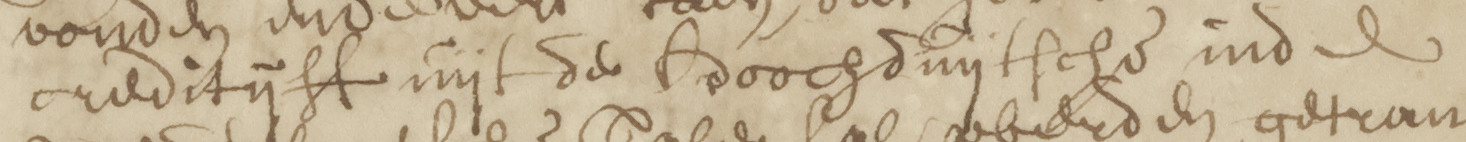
creditijff uijt de Hoochduijtsche inde
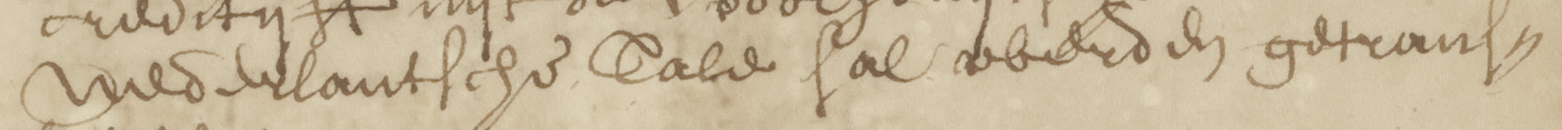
Nederlantsche Tale sal werden getrans„
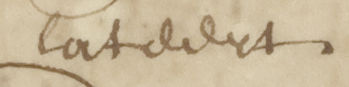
lateert.
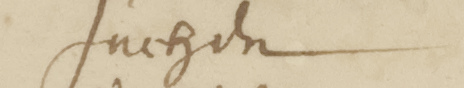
Juchen
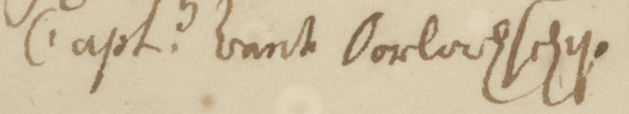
Captn. vant Oorlochschip
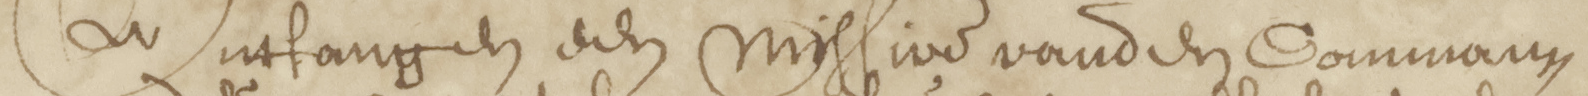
Ontfangen een missive vanden comman,,
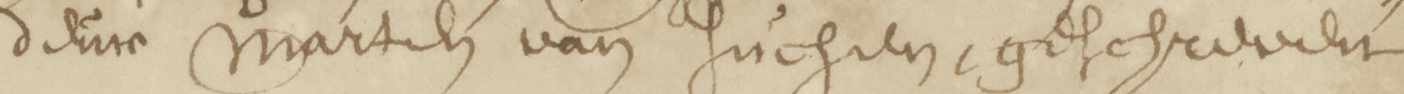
deur Marten van Juchen, geschreven
